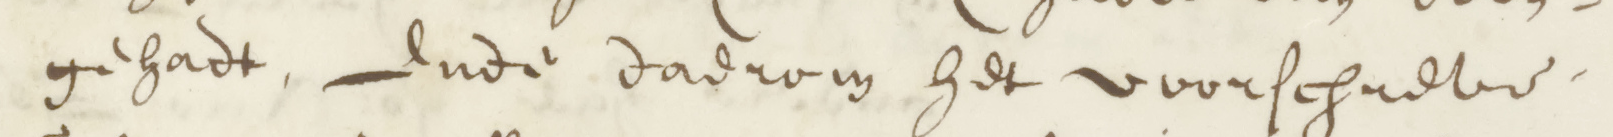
gehadt, ende daerom het voorschreve
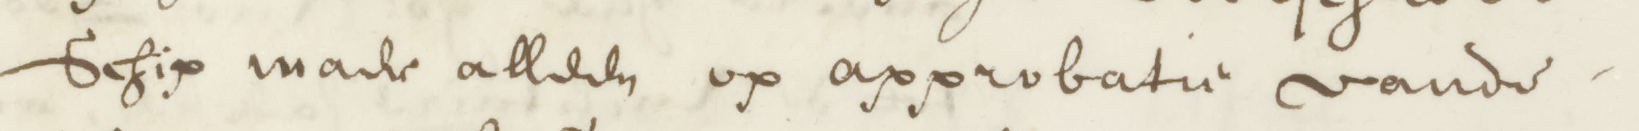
Schip maer alleen op approbatie vande
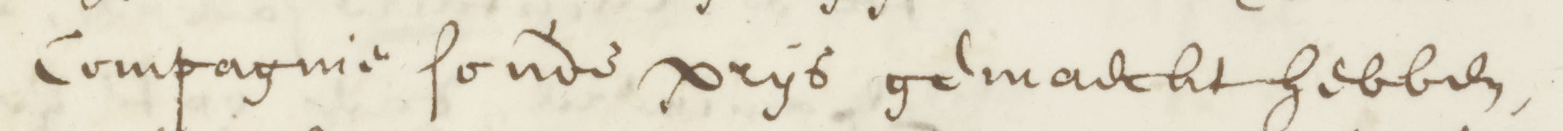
Compagnie soude prijs gemaeckt hebben,
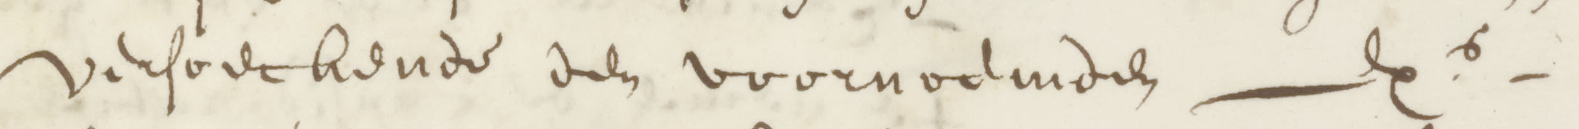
versoeckende den voornoemden Exs. -
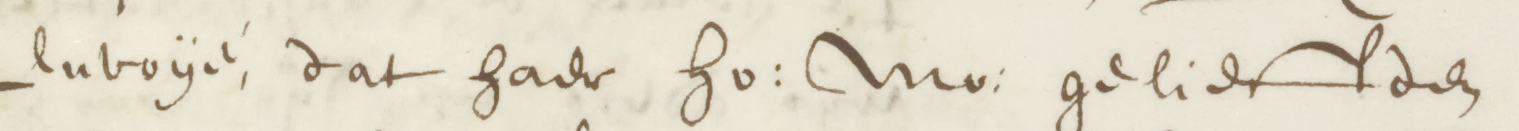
Envoijé, dat haer ho:Mo: gelieffden
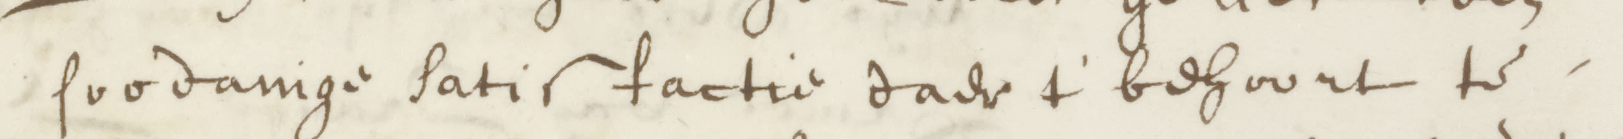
soodanige satisfactie daer t‛ behoort te
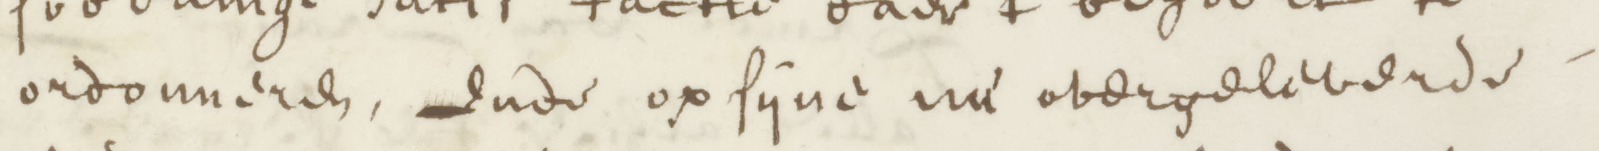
ordonneren, ende op sijne nu overgeleverde
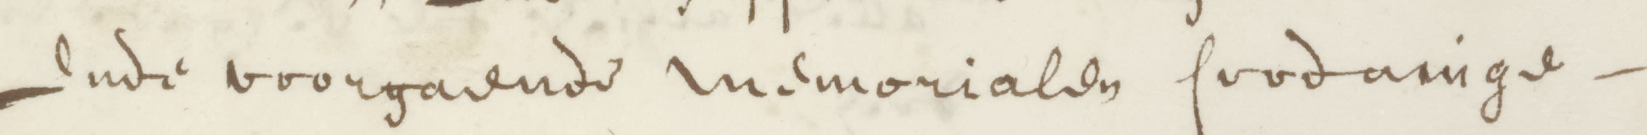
ende voorgaende memorialen soodanige -
